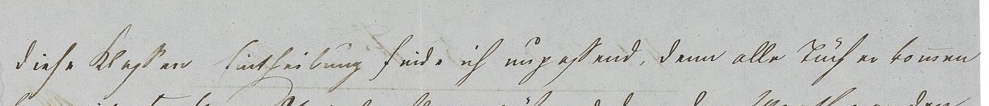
Diese Klassen Eintheilung finde ich unpassend, denn alle Tücher kommen
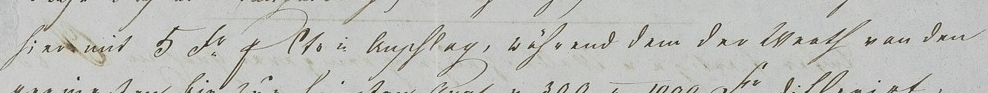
hier mit 5 Fr p Ctr in Anschlag, während dem der Werth von den
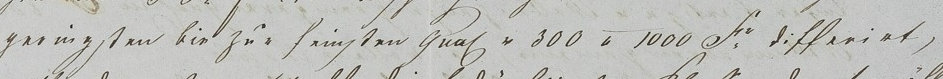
geringsten bis zur feinsten Qualität v 300 à 1000 Fr differirt,
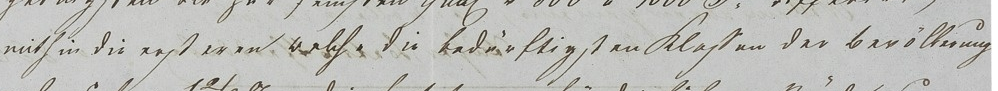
mithin die ersteren welche die bedürftigsten Klassen der Bevölkerung
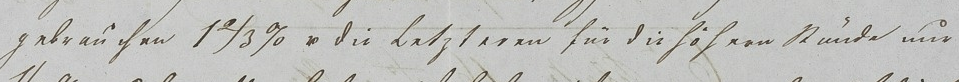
gebrauchen 1⅔% & die Letzteren für die höhern Stände nur
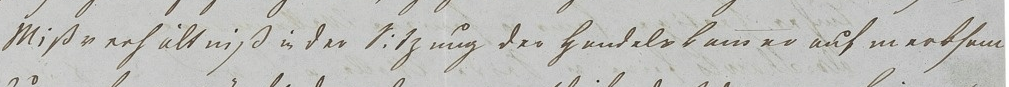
Mißverhältniß in der Sitzung der Handelskammer aufmerksam
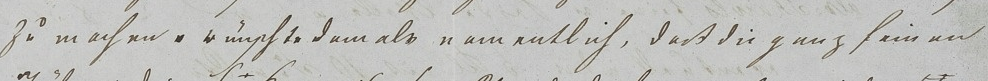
zu machen & wünschte damals namentlich, daß die ganz feinen
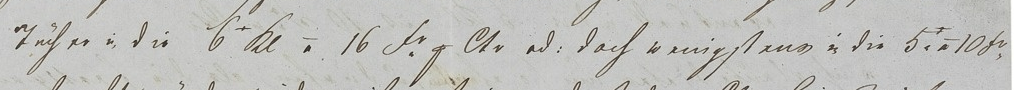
Tücher in die 6t Kl à 16 Fr p Ctr od: doch wenigstens in die 5t à 10 Fr
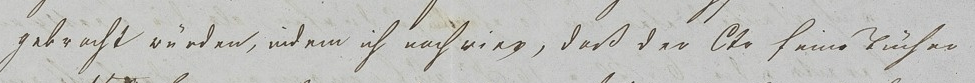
gebracht würden, indem ich nachwies, daß der Ctr feiner Tücher
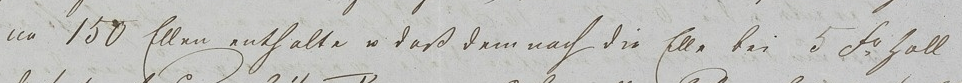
cca 150 Ellen enthalte & daß demnach die Elle bei 5 Fr Zoll
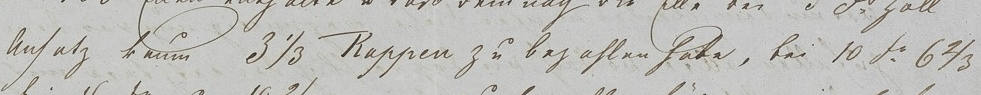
Ansatz kaum 3⅓ Rappen zu bezahlen habe, bei 10 Fr 6⅔
